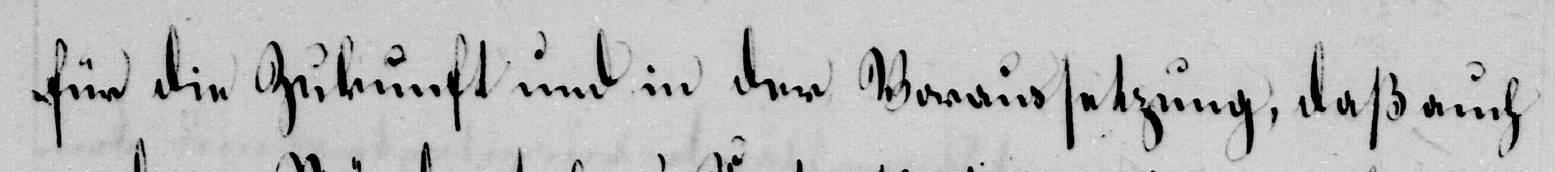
für die Zukunft und in der Voraussetzung, daß auch
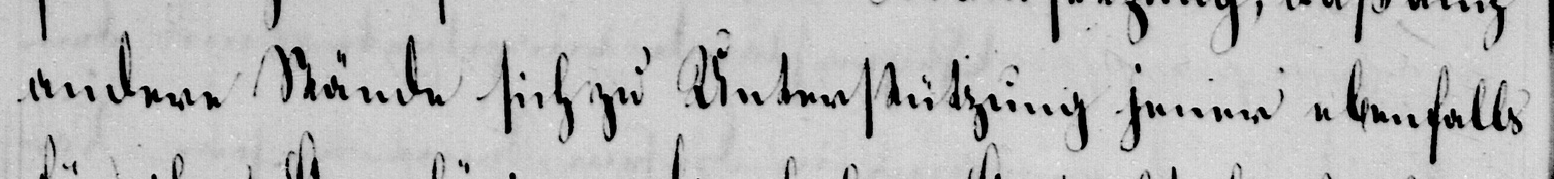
andere Stände sich zu Unterstützung jener ebenfalls
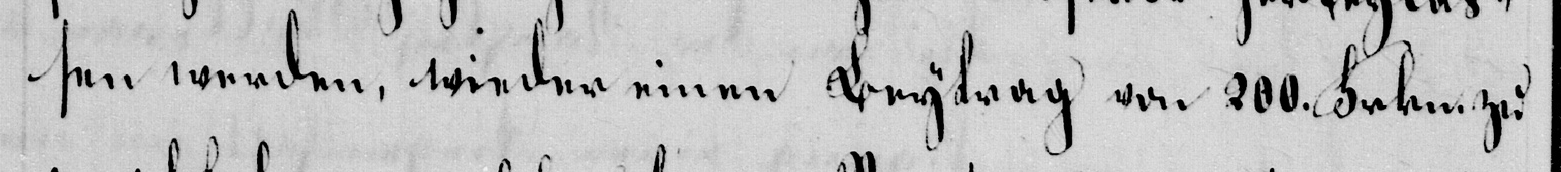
en werden, wieder einen Beytrag von 200. Frkn. zu
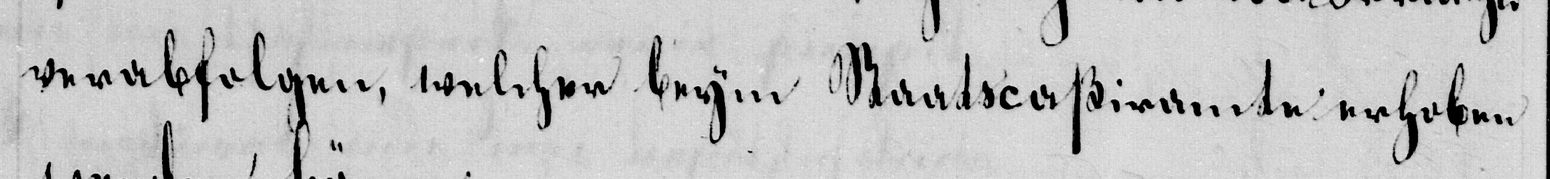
verabfolgen, welcher beym Staatscaßiramte erhoben
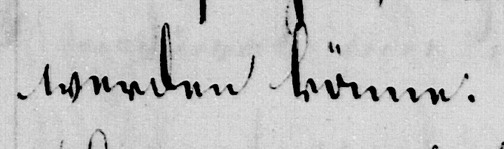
werden könne.
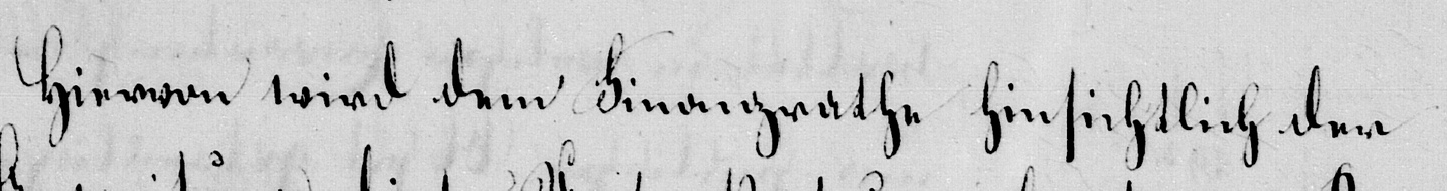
Hiervon wird dem Finanzrathe hinsichtlich der
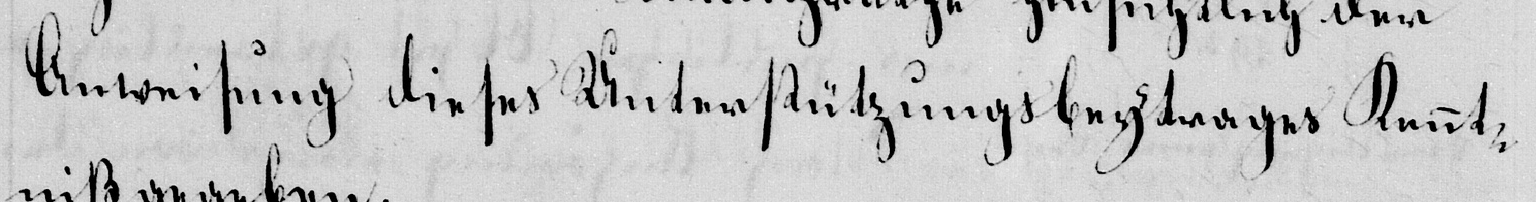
Anweisung dieses Unterstützungsbeytrages Kennt¬
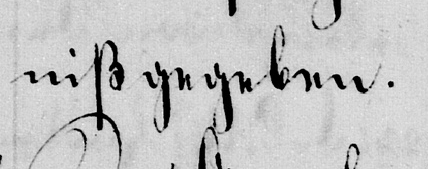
niß gegeben.
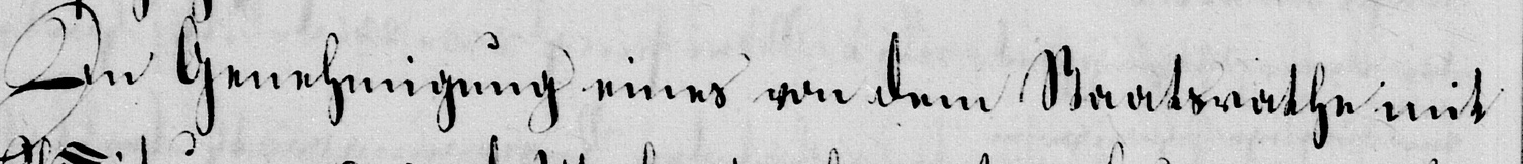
In Genehmigung eines von dem Staatsrathe mit
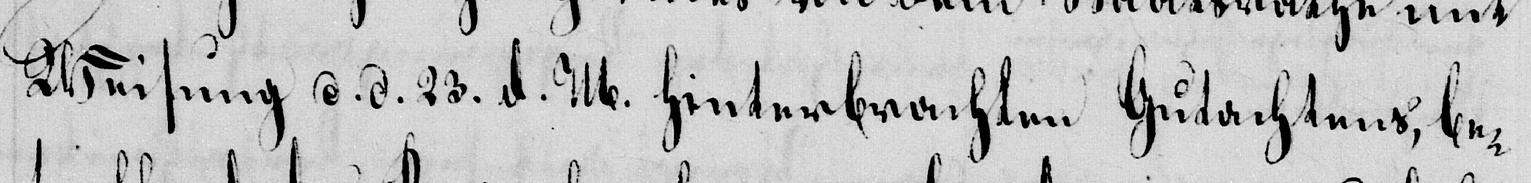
Weisung d. d. 23. d. M. hinterbrachten Gutachtens, be¬
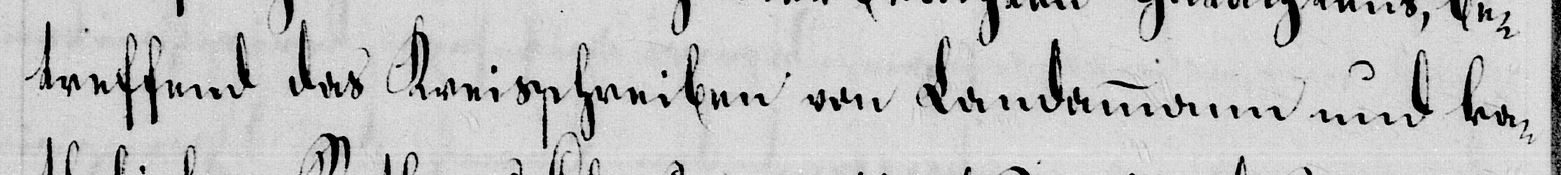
treffend das Kreisschreiben von Landammann und ka¬
